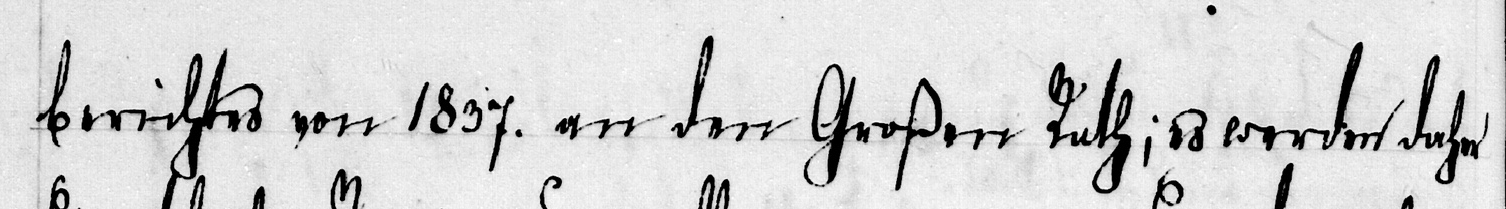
berichtes von 1837. an den Großen Rath; es werden daher
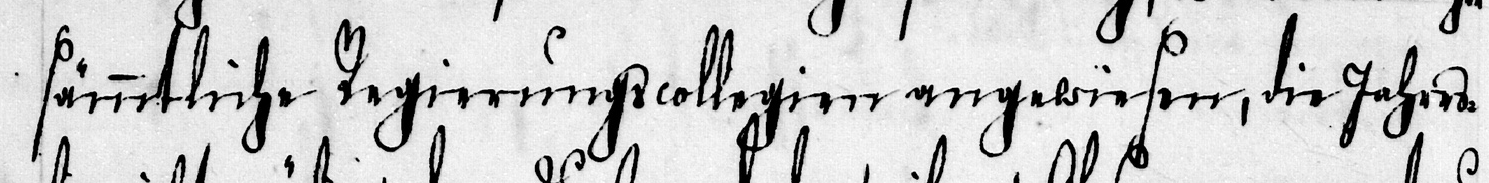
sämmtliche Regierungscollegien angewiesen, die Jahres¬
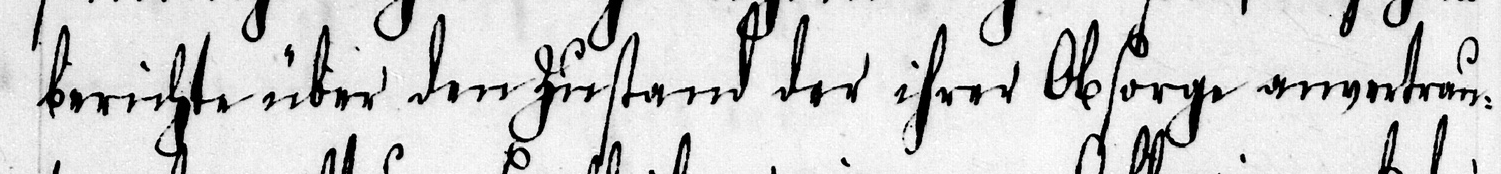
berichte über den Zustand der ihrer Absorge anvertrau¬
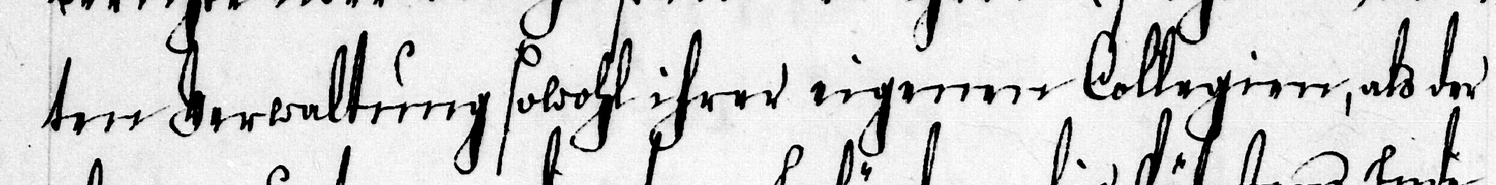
ten Verwaltung sowohl ihrer eigenen Collegien, als der
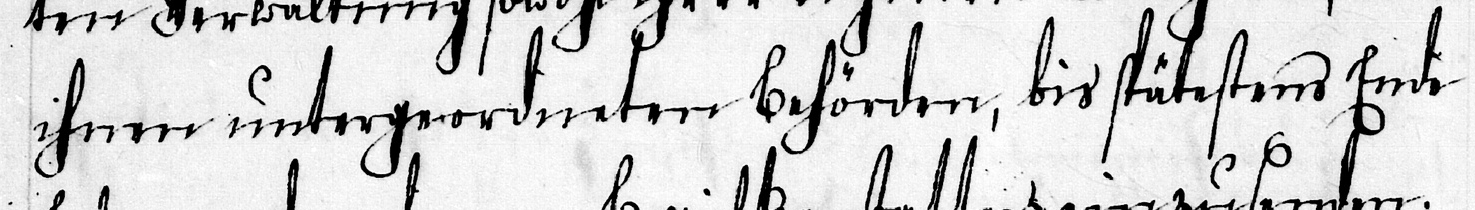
ihnen untergeordneten Behörden, bis spätestens Ende
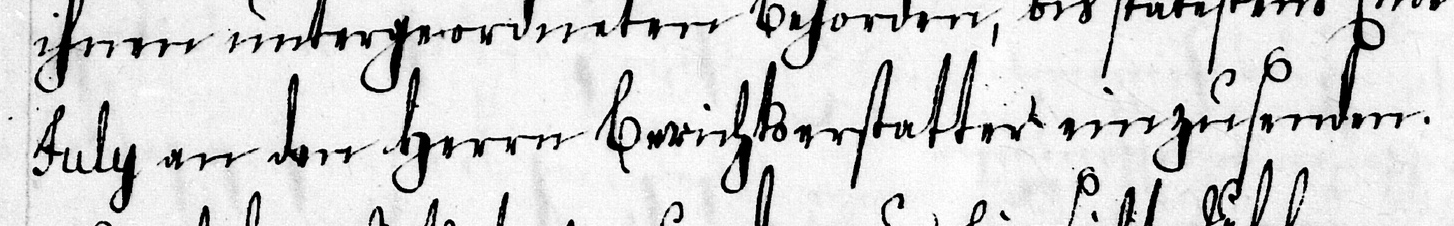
July an den Herrn Berichtserstatter einzusenden.
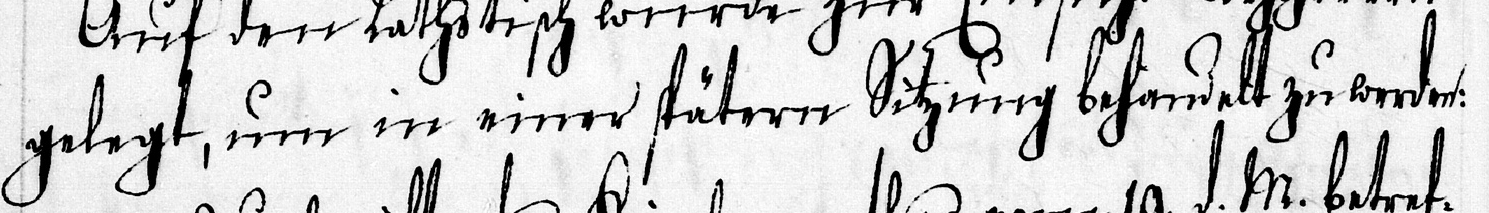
gelegt, um in einer spätern Sitzung behandelt zu werden:
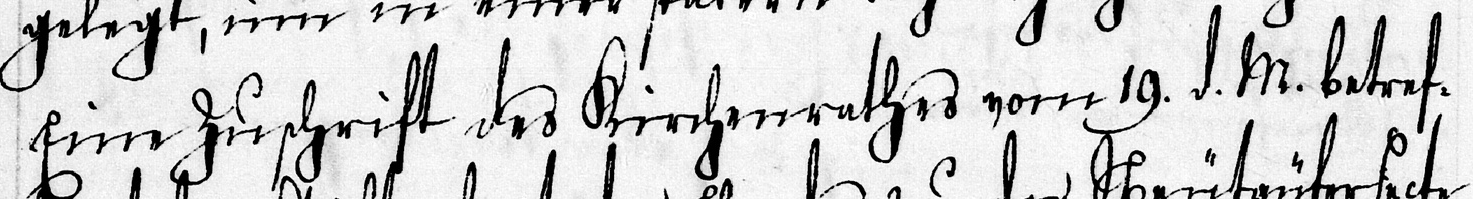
Eine Zuschrift des Kirchenrathes vom 19. d. M. betref¬
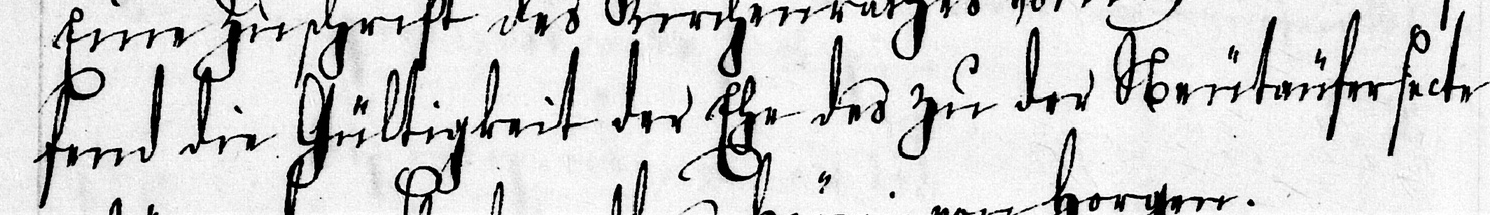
fend die Gültigkeit der Ehe des zu der Neutäufersecte
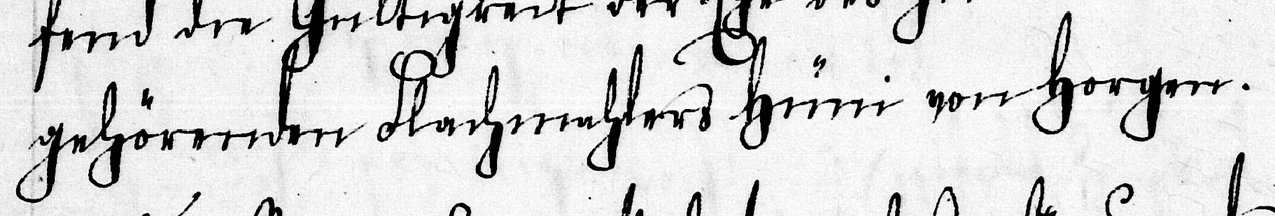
gehörenden Flachmahlers Hüni von Horgen.
